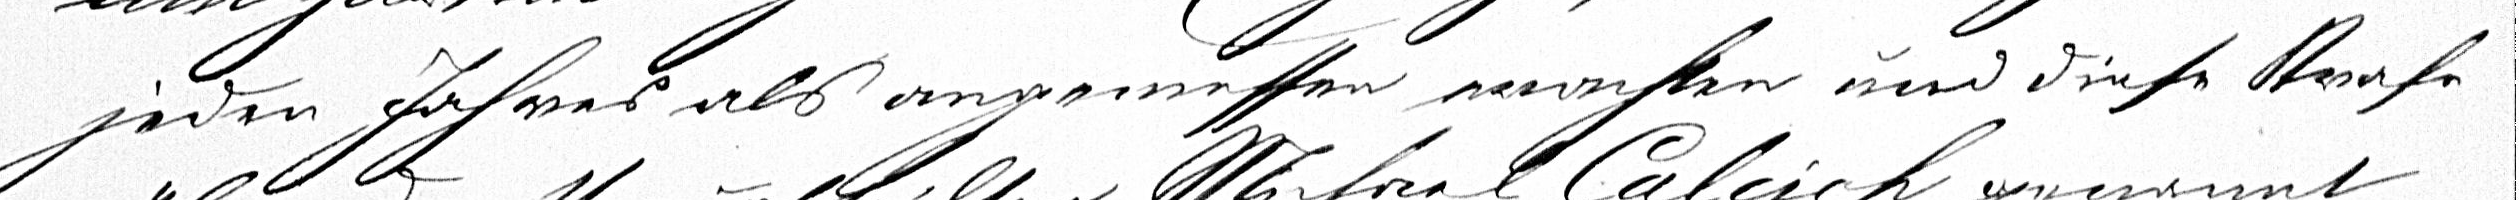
jeden Jahres als angemessen machten und diese Strafe
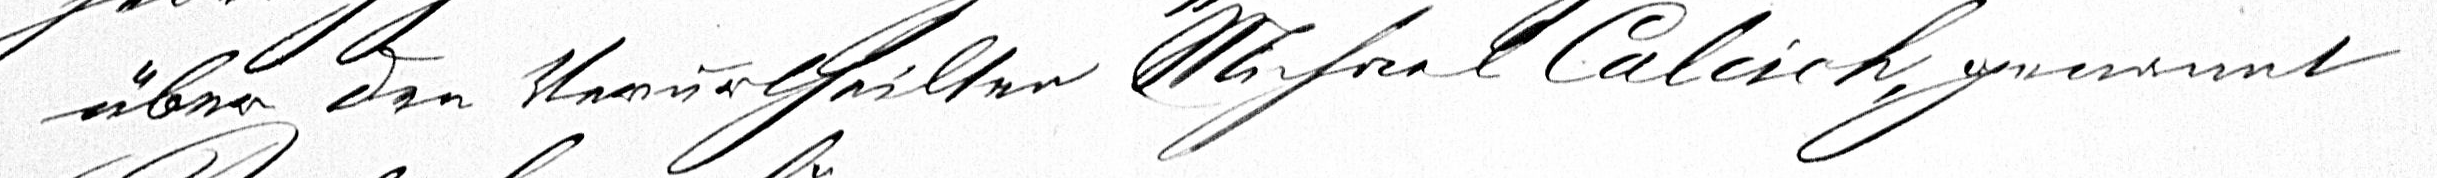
über den Verurtheilten Michael Calcich, genannt
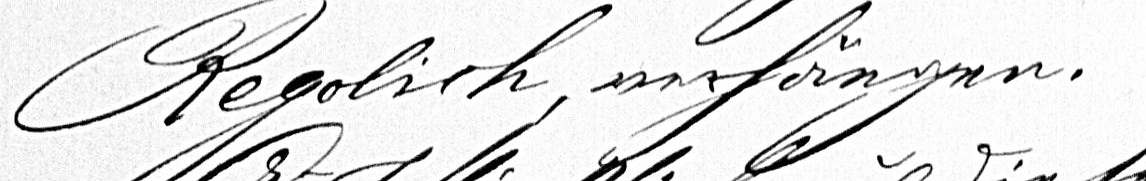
Regolich, verhängen.
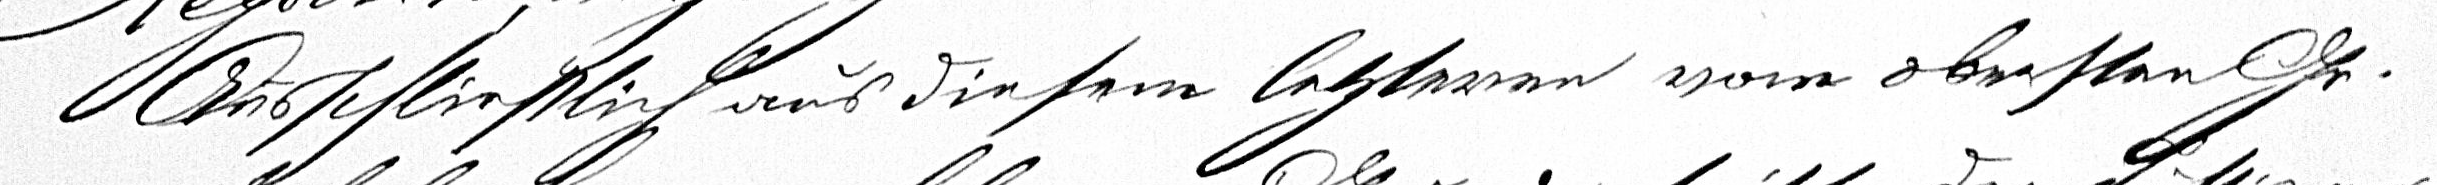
Ausschließlich aus diesem letzteren vom obersten Ge¬
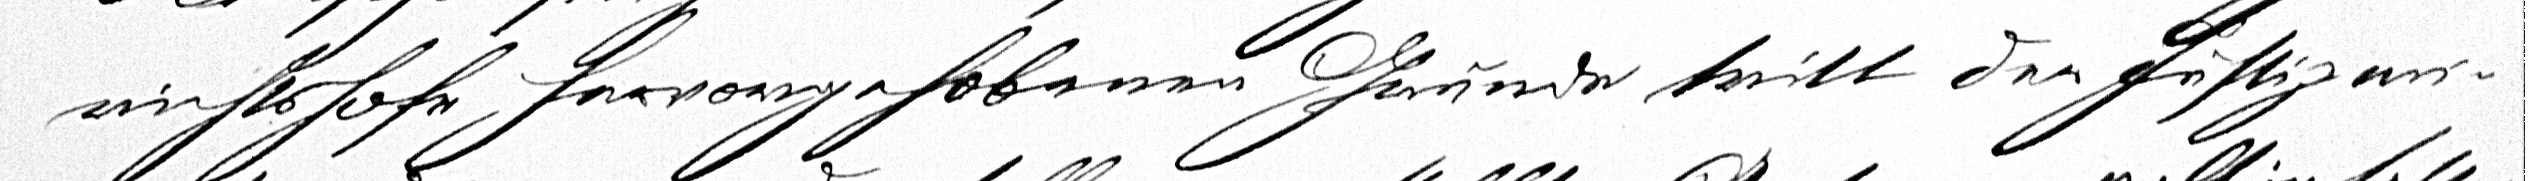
richtshofe hervorgehobenen Grunde tritt den Justizmi¬
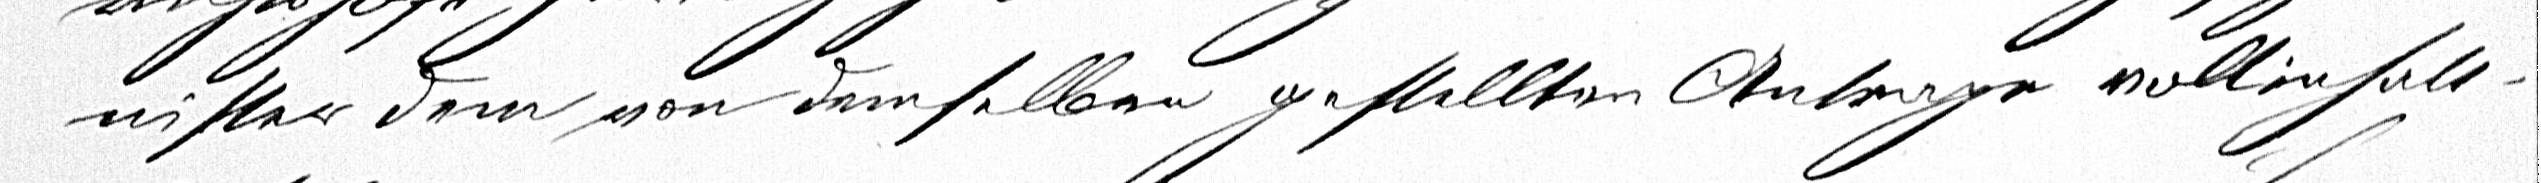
nister dem von demselben gestellten Antrage vollinhalt¬
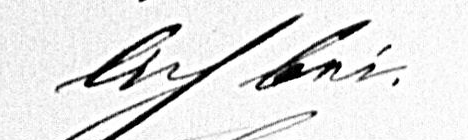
lich bei.
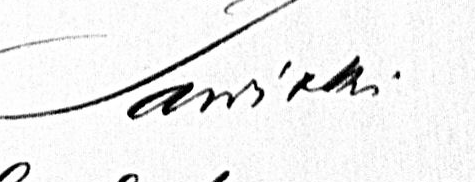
Sawixxki
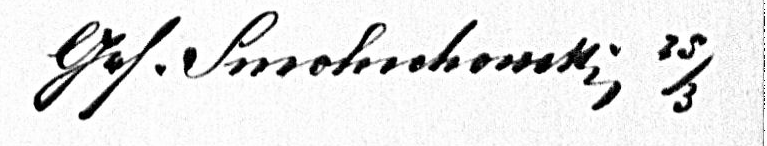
Ges. Smohxx 25/3
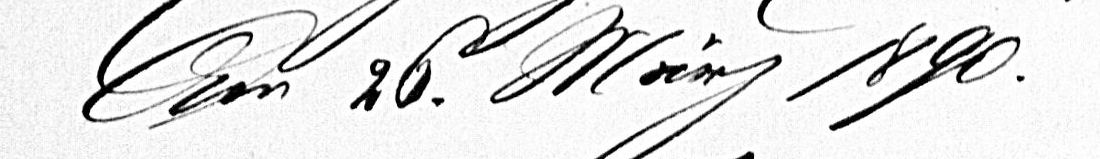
Am 26. März 1890.
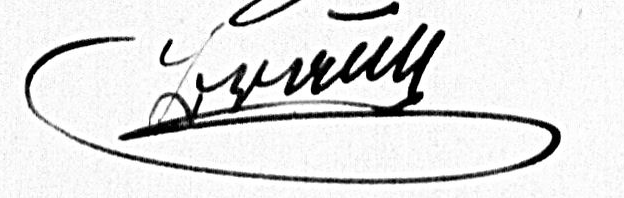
Braun
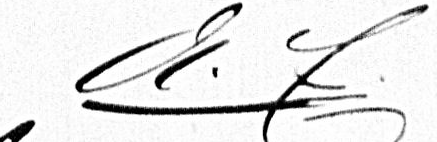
A. E.
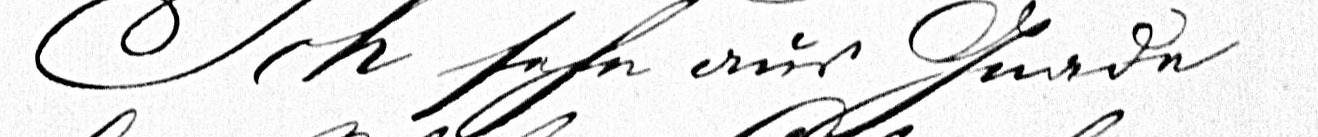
Ich sehe aus Gnade
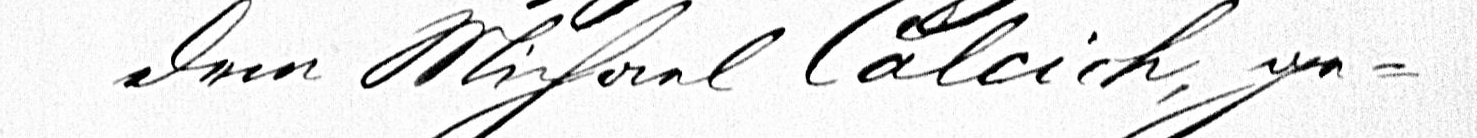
dem Michael Calcich, ge-
